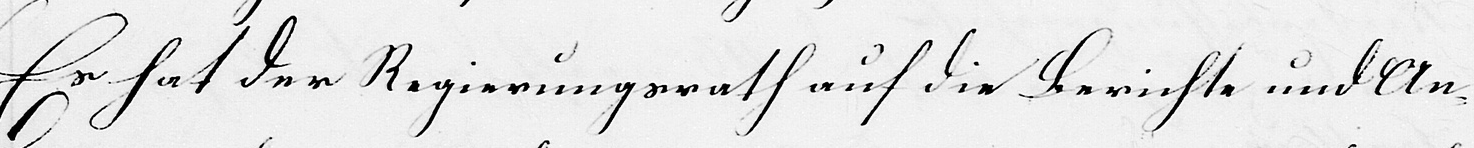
Es hat der Regierungsrath auf die Berichte und An¬
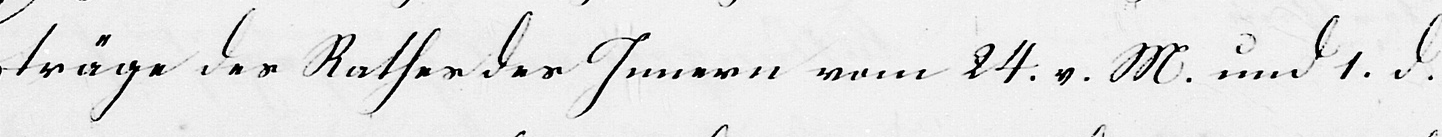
träge des Rathes des Innern vom 24. v. M. und 1. d.
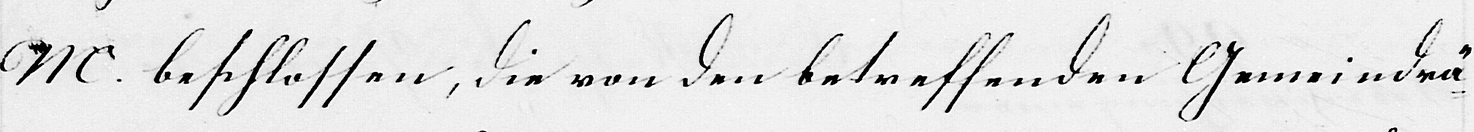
M. beschlossen, die von den betreffenden Gemeindrä¬
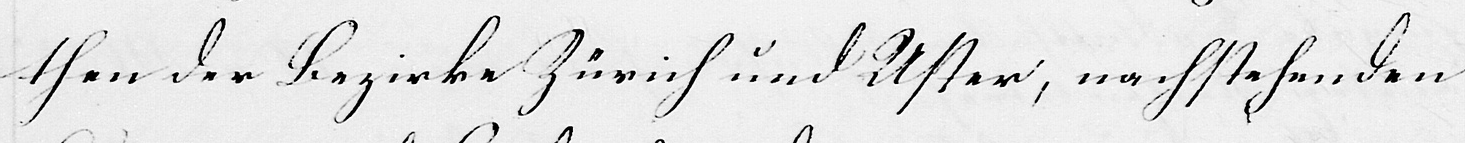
then der Bezirke Zürich und Uster, nachstehenden
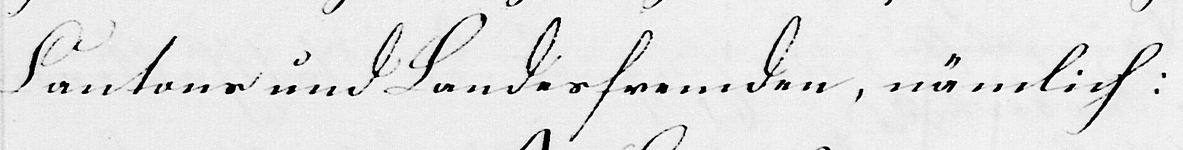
Cantons und Landesfremden, nämlich:
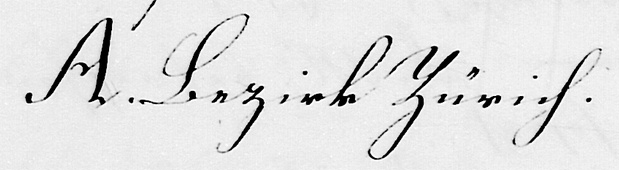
A. Bezirk Zürich.
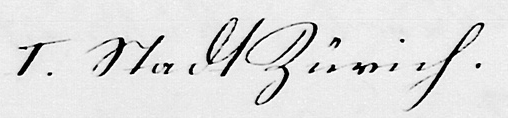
I. Stadt Zürich.
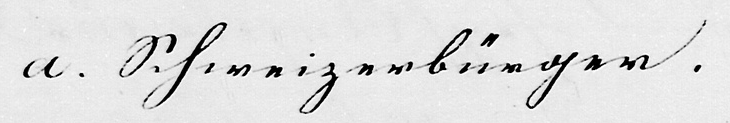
a. Schweizerbürger.
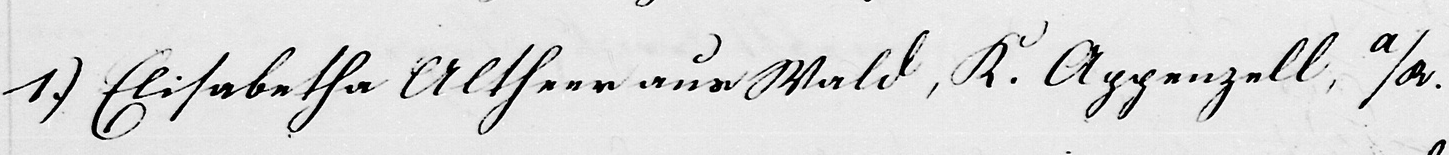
1.) Elisabetha Altheer aus Wald, K. Appenzell, A/R.
